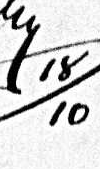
18/10
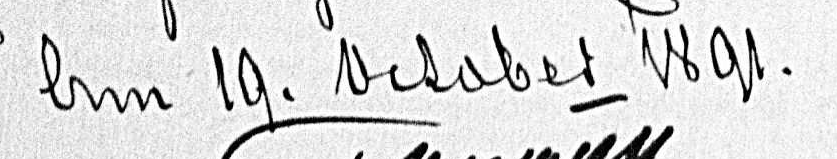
Am 19. October 1891
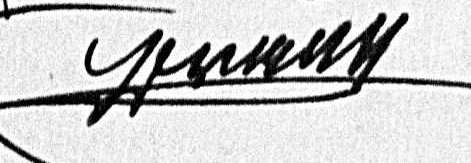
Braun
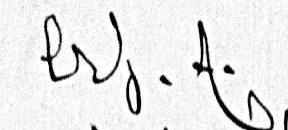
Ah E
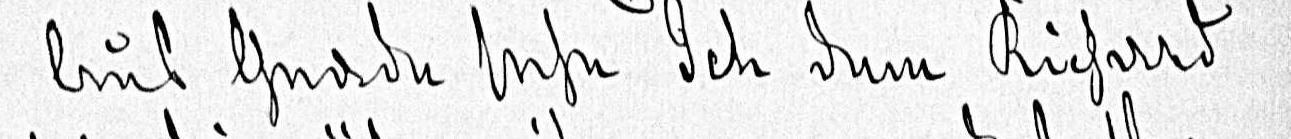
Aus Gnade sehe ich dem Richard
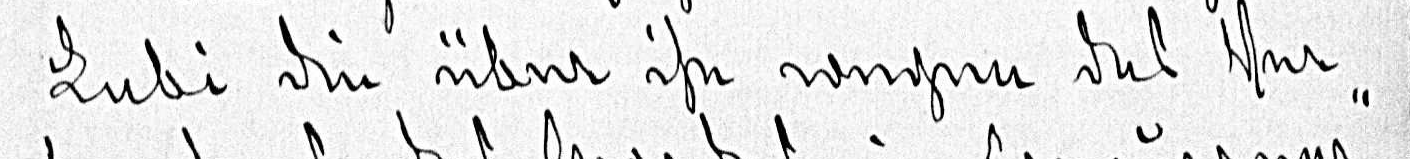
Lubi die über ihn wegen des Ver¬
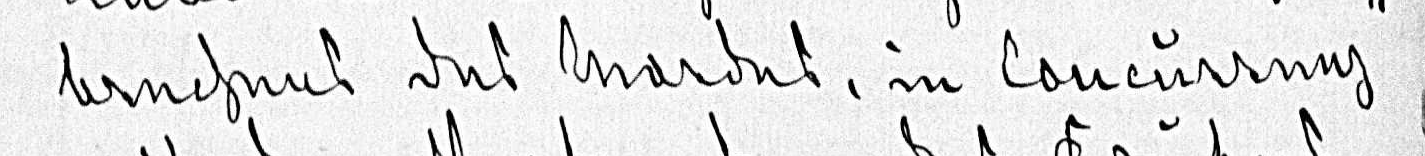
brechens des Mordes, in Concurrenz
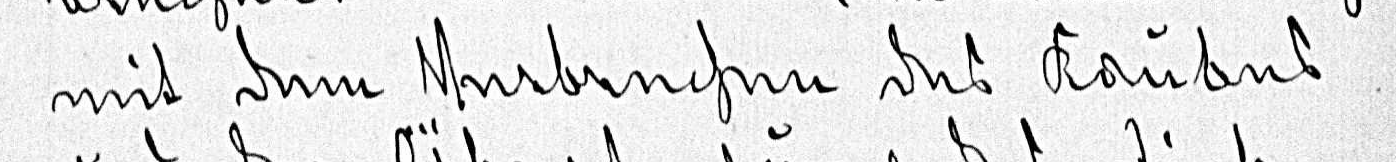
mit dem Verbrechen des Raubes
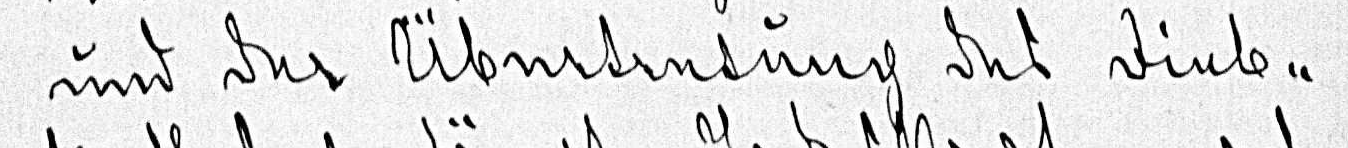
und der Übertretung des Dieb¬
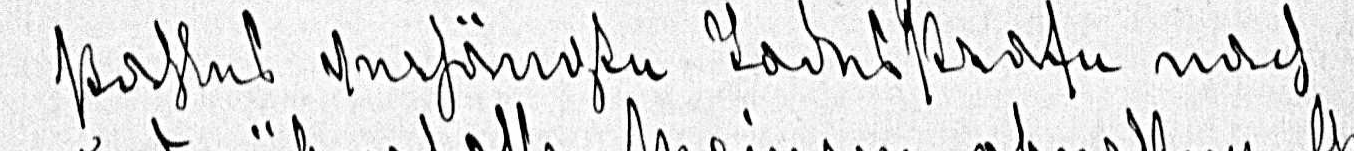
stahles verhängte Todesstrafe nach
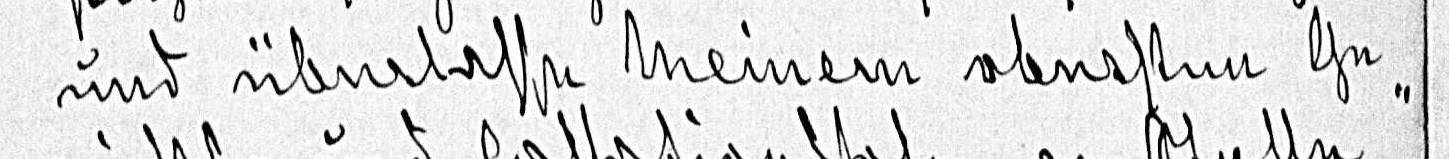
und überlasse Meinem obersten Ge¬
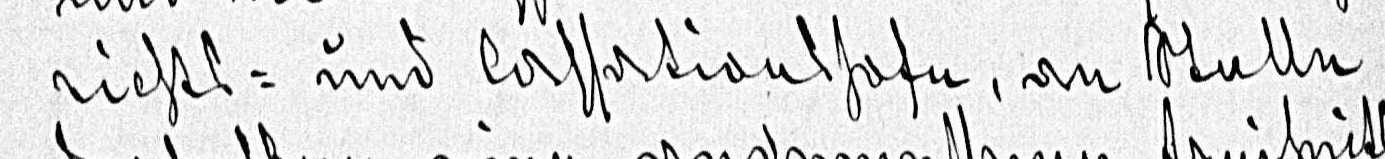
richts- und Cassationshofe, an Stelle
